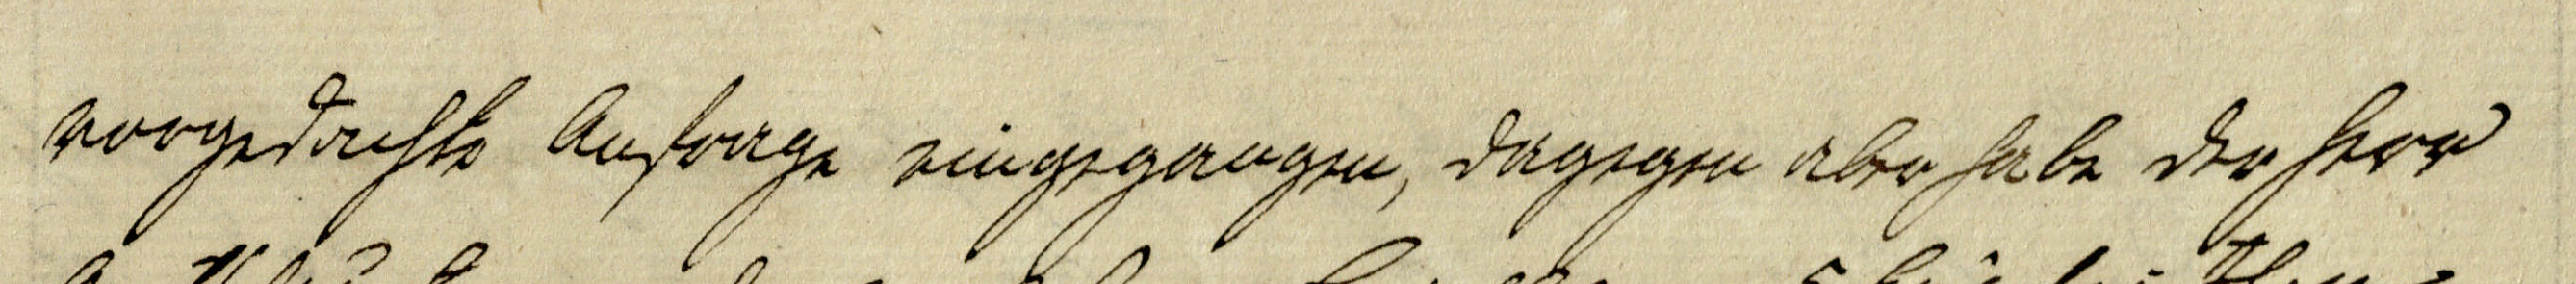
vorgedachte Anfrage eingegangen, dagegen aber habe der Herr
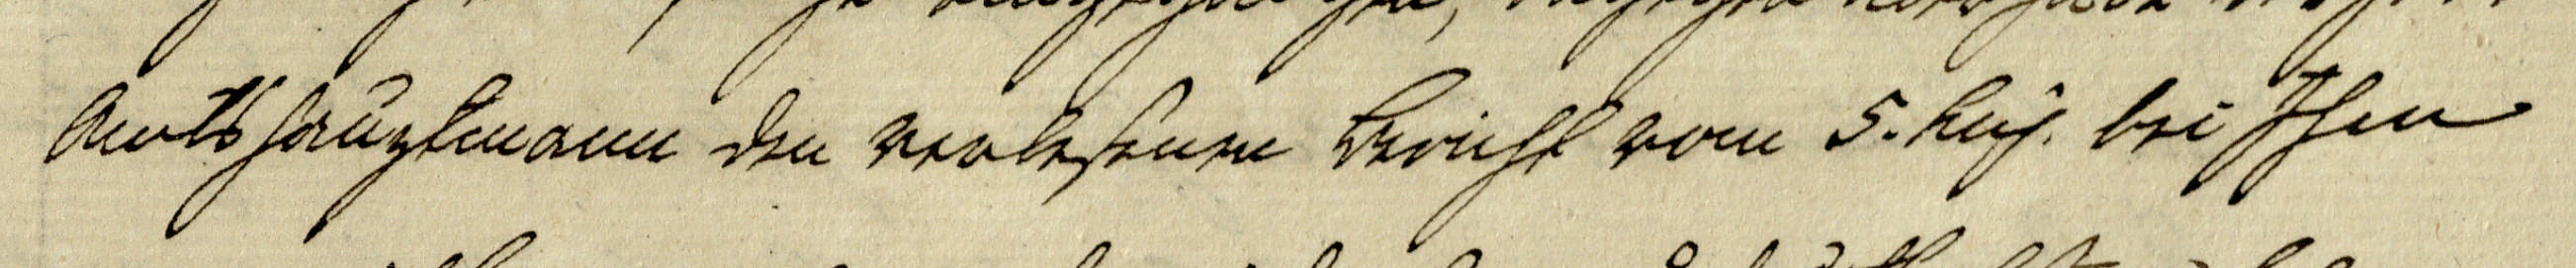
Amtshauptmann den verlesenen Bericht vom 5. huj. bei Ihm
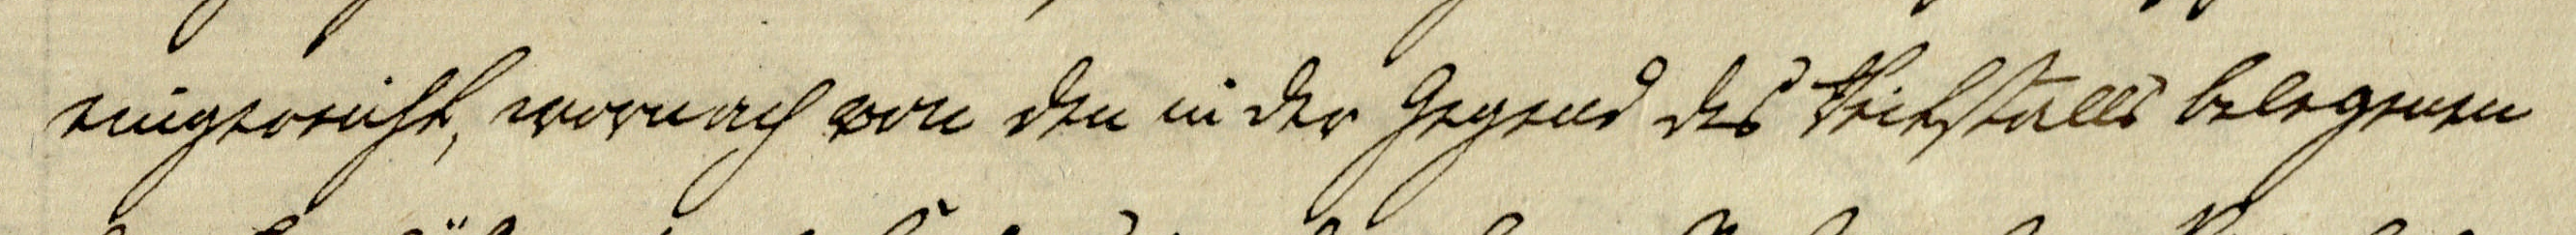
eingereicht, wornach von den in der Gegend des Reitstalls belegenen
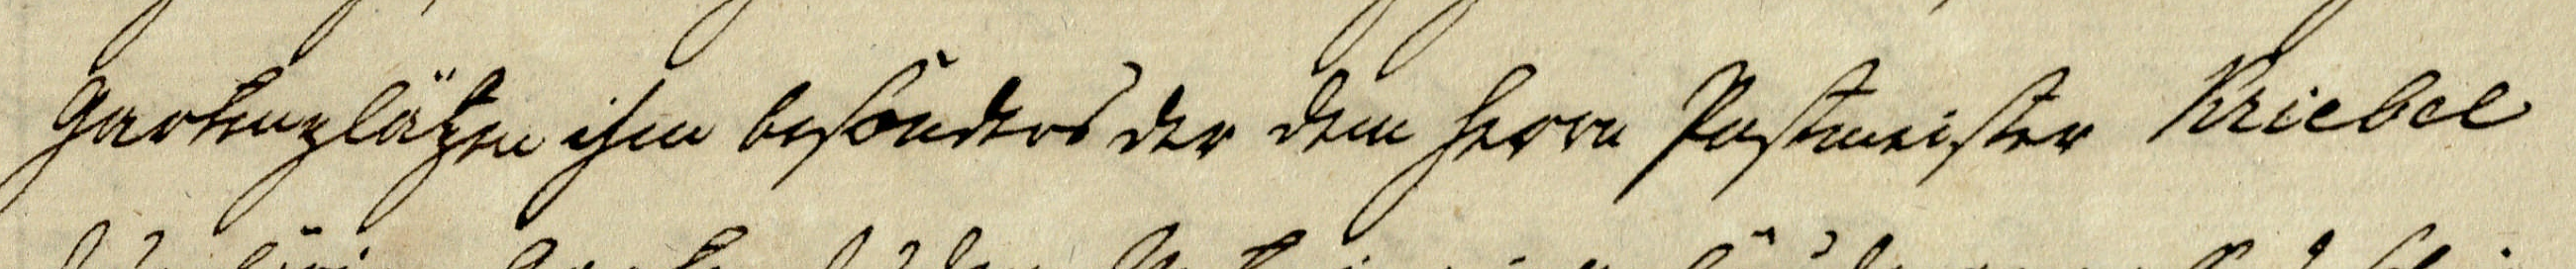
Gartenplätzen ihm besonders der dem Herrn Postmeister Kriebel
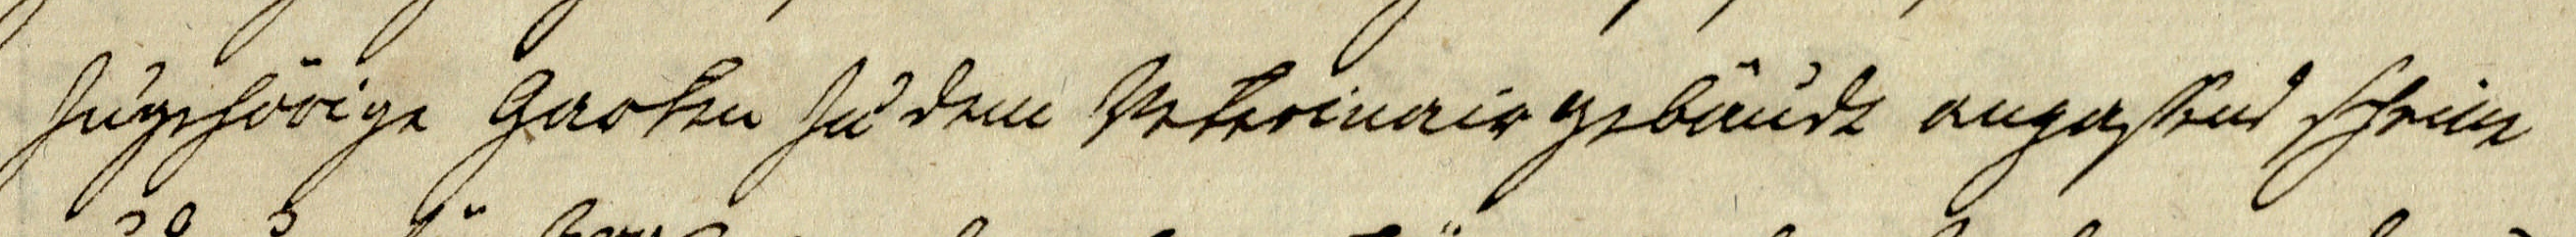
zugehörige Garten zu dem Veterinair Gebäude anpassend scheine
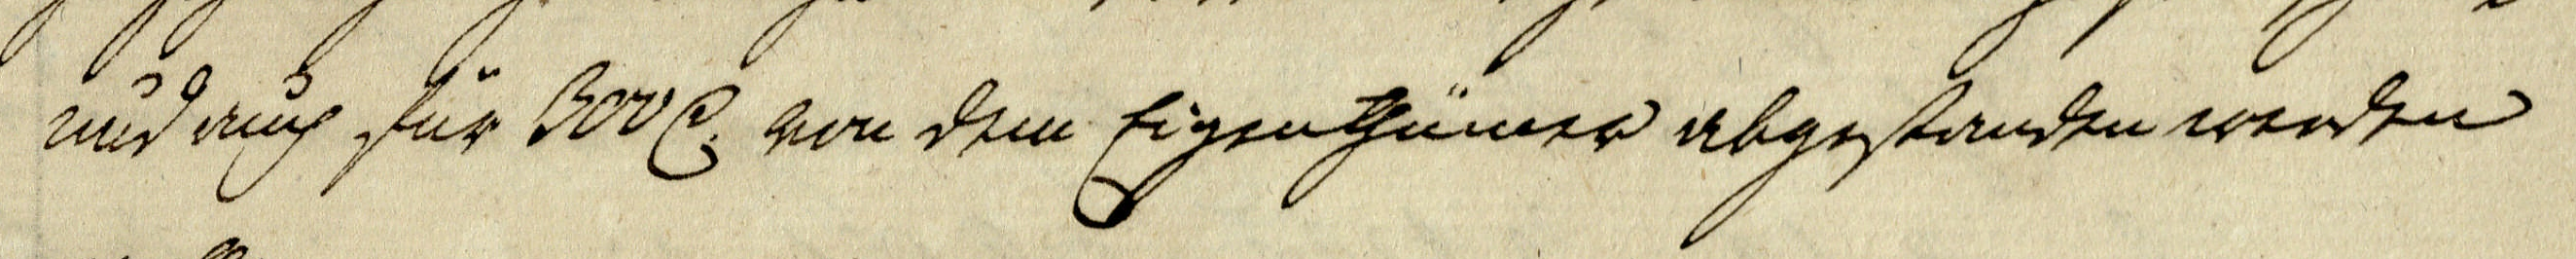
und auch für 300 l. von dem Eigenthümer abgestanden werden
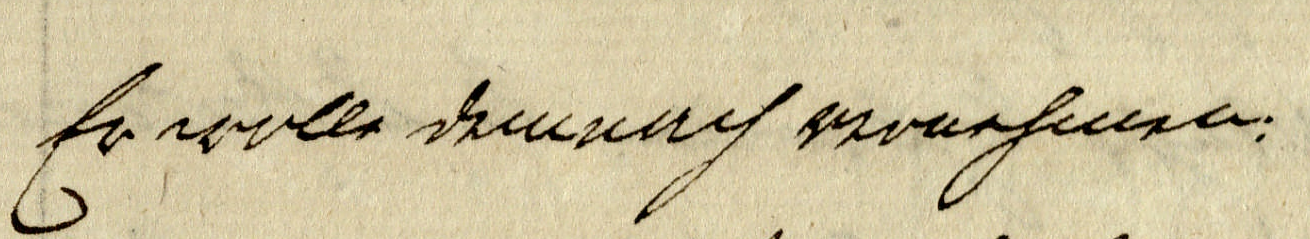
Er wolle demnach vernehmen:
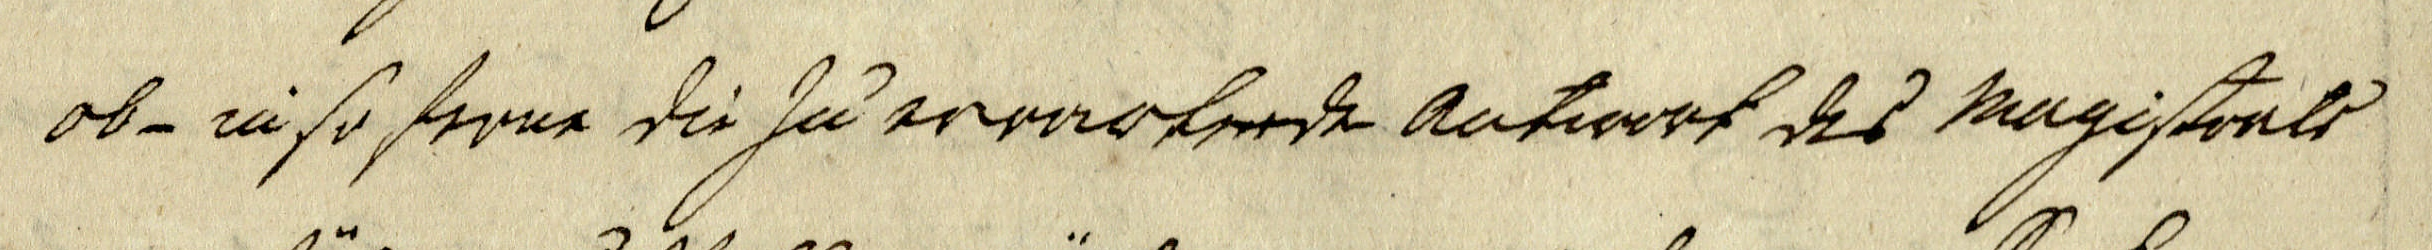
ob - in so ferne die zu erwartende Antwort des Magistrats
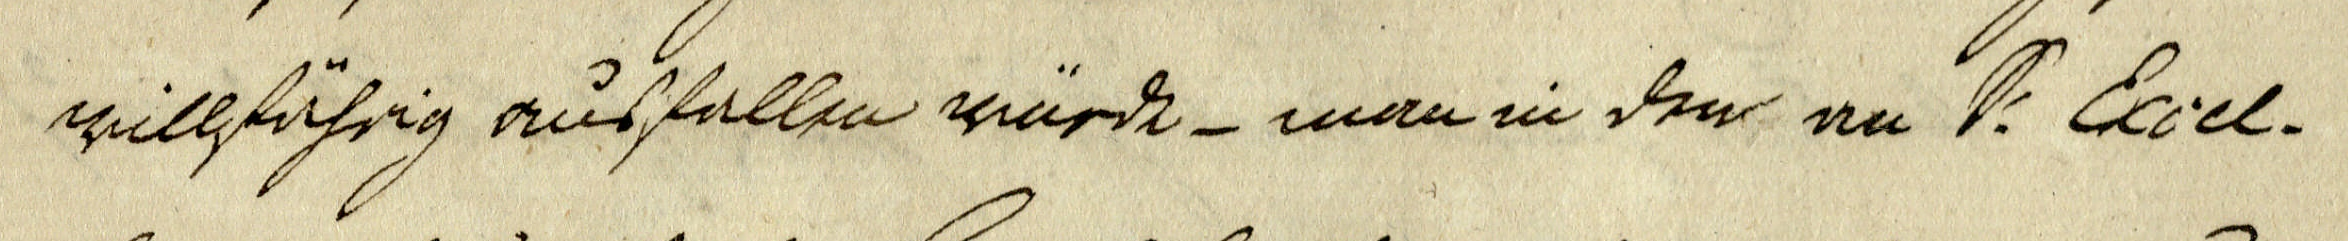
willfährig ausfallen würde - man in den an Sr. Excel¬
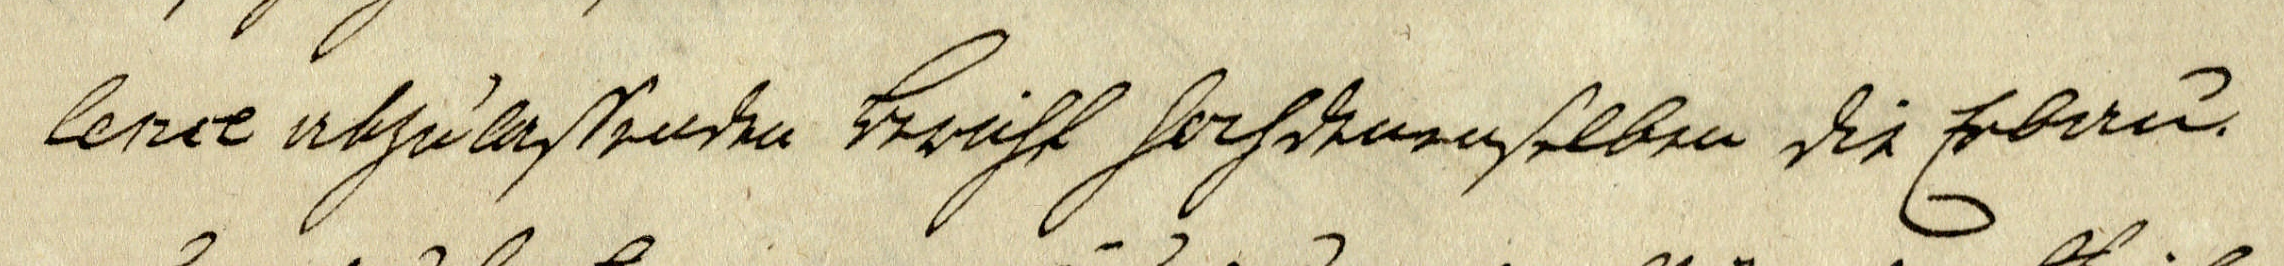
lence abzulassenden Bericht hochdenenselben die Erbau¬
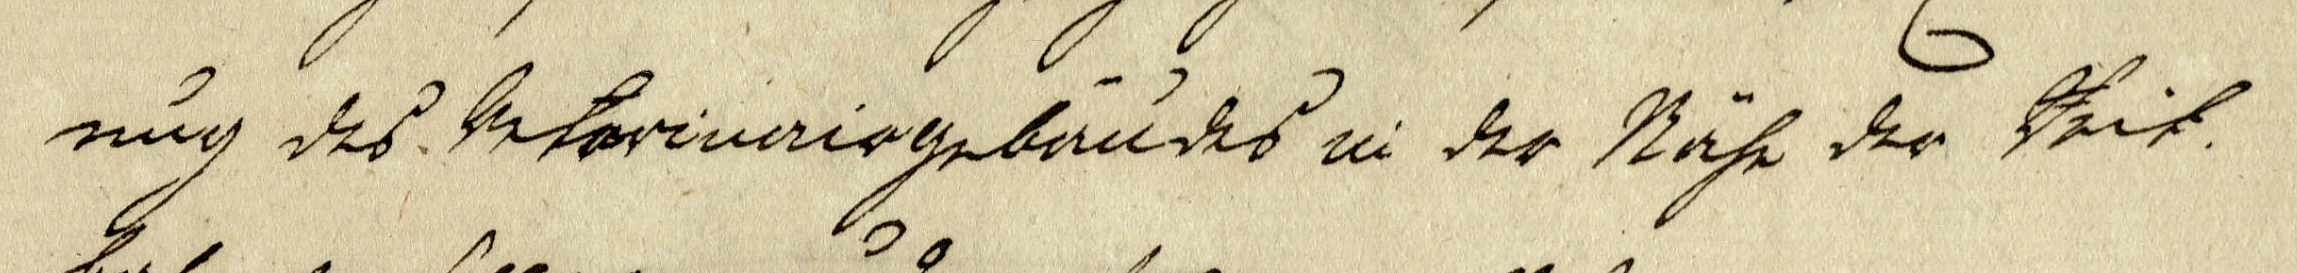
ung des Veterinairgebäudes in der Nähe der Reit¬
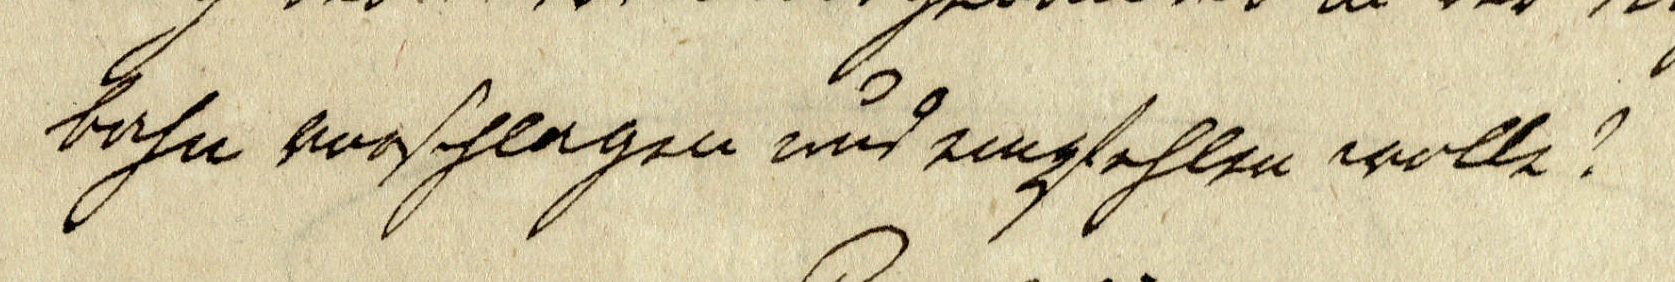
bahn vorschlagen und empfehlen wolle?
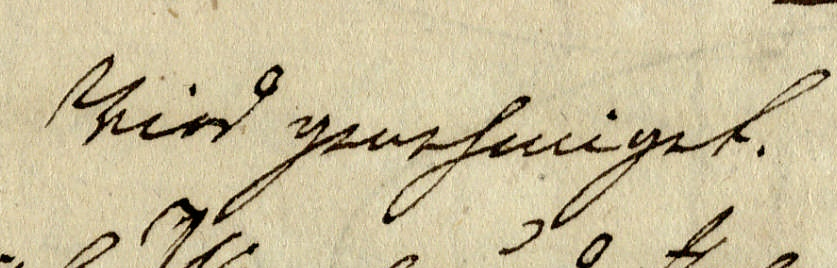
Wird genehmiget.
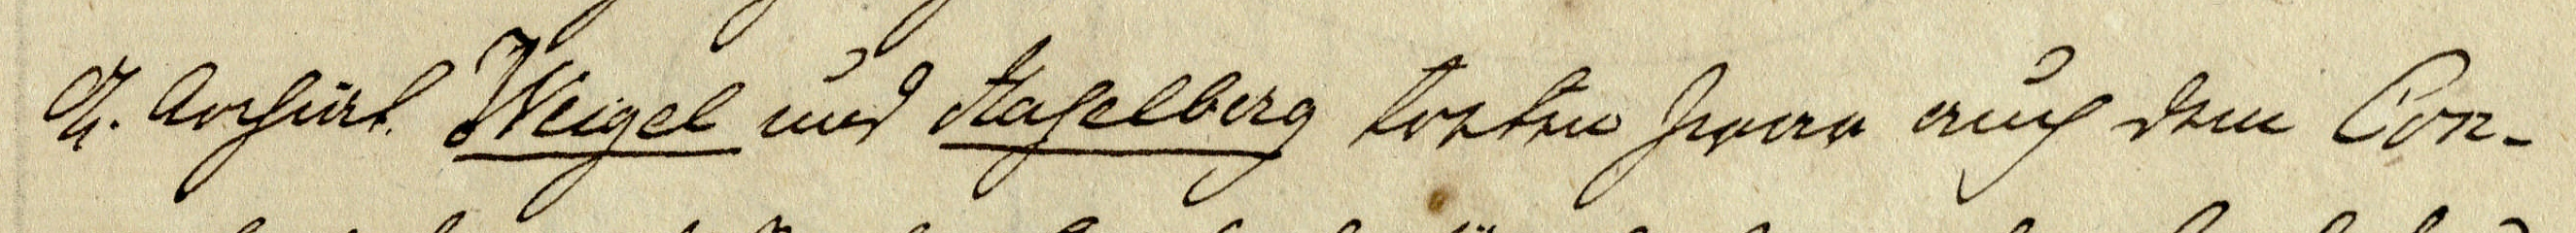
dh. Archiat. Weigel und Haselberg treten zwar auch dem Con¬
